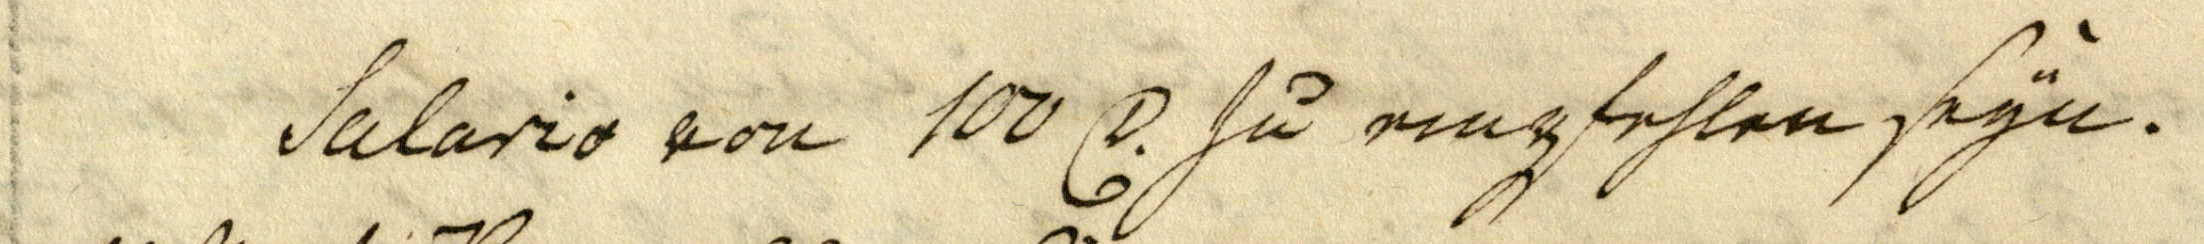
Salario von 100 rtl. zu empfehlen seyn.
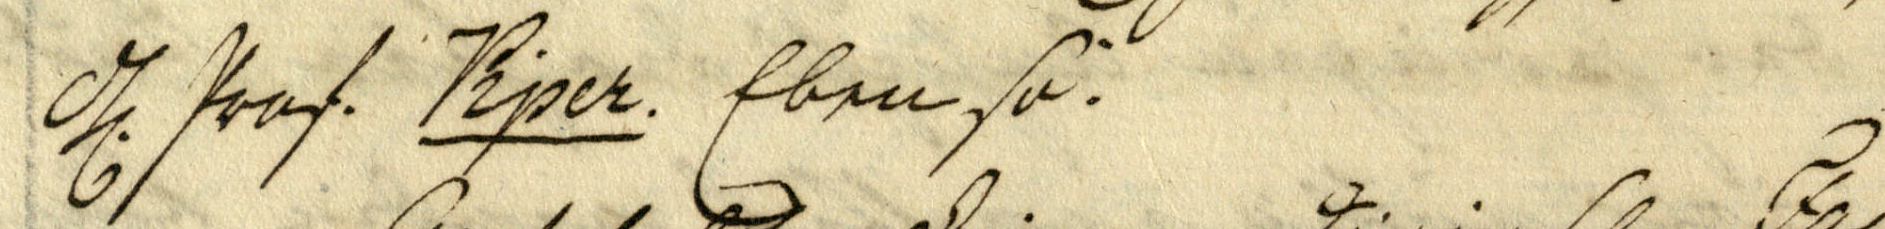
dh. Prof. Piper. Ebenso.
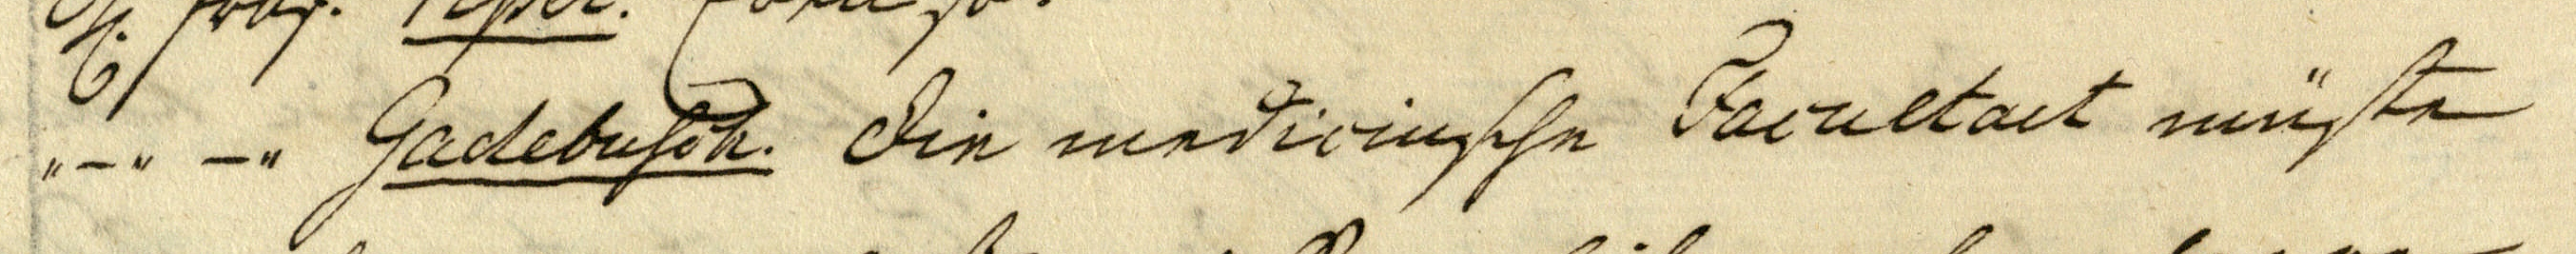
" - " - " Gadebusch. Die medicinische Facultaet müßte
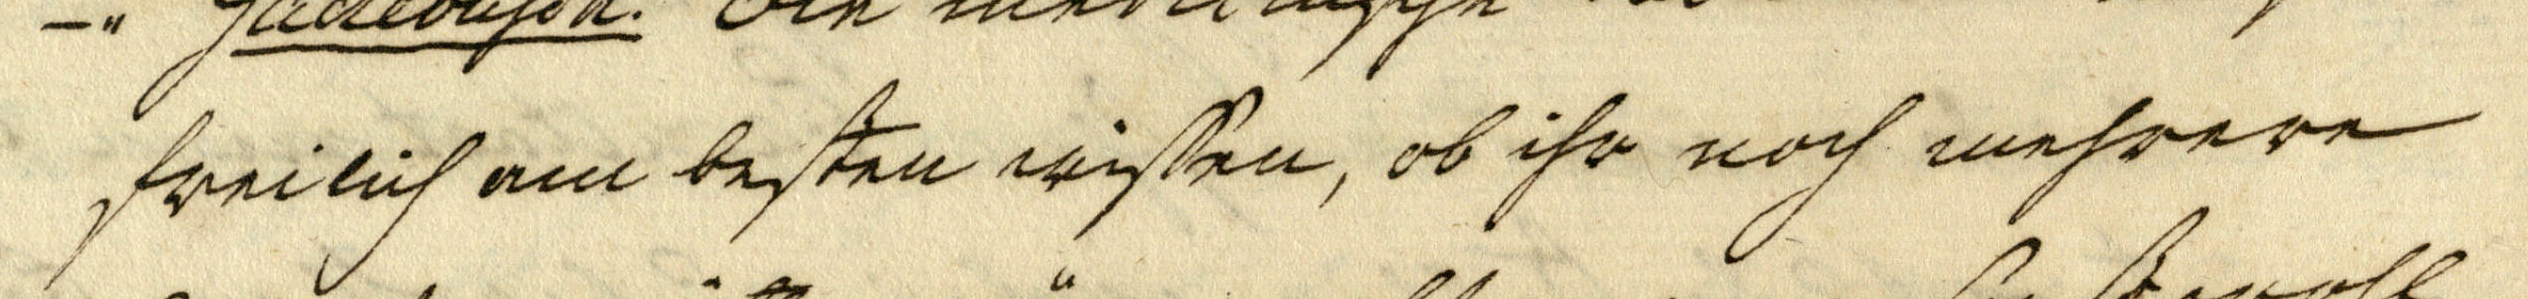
freilich am besten wissen, ob ihr noch mehrere
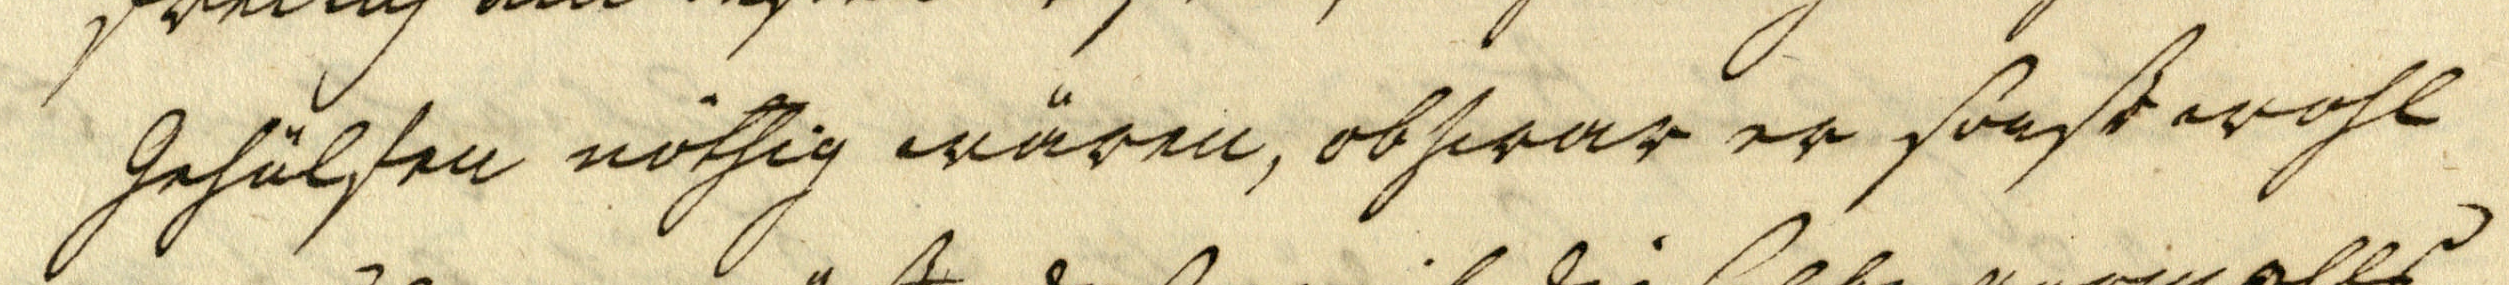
Gehülfen nöthig wären, obzwar er sonst wohl
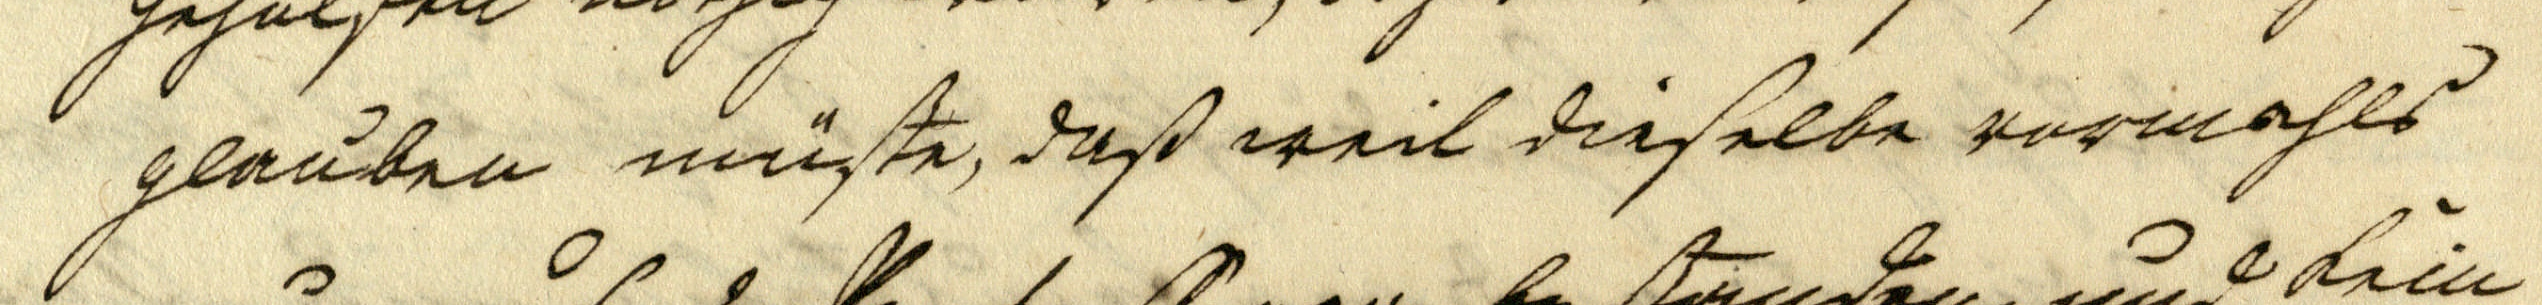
glauben müßte, daß weil dieselbe vormahls
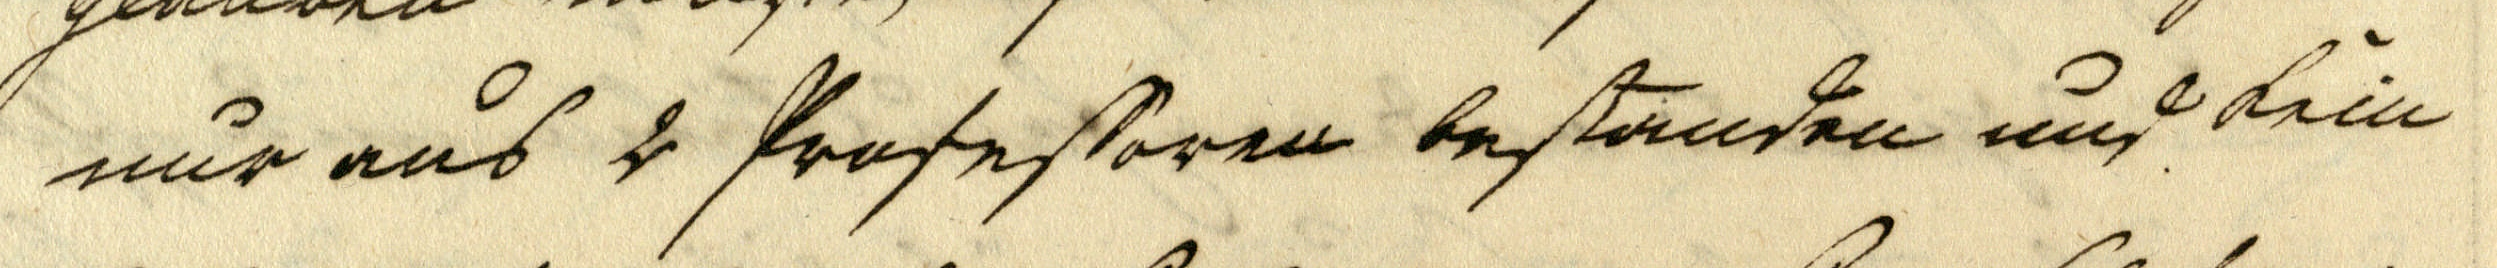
nur aus 2 Professoren bestanden und kein
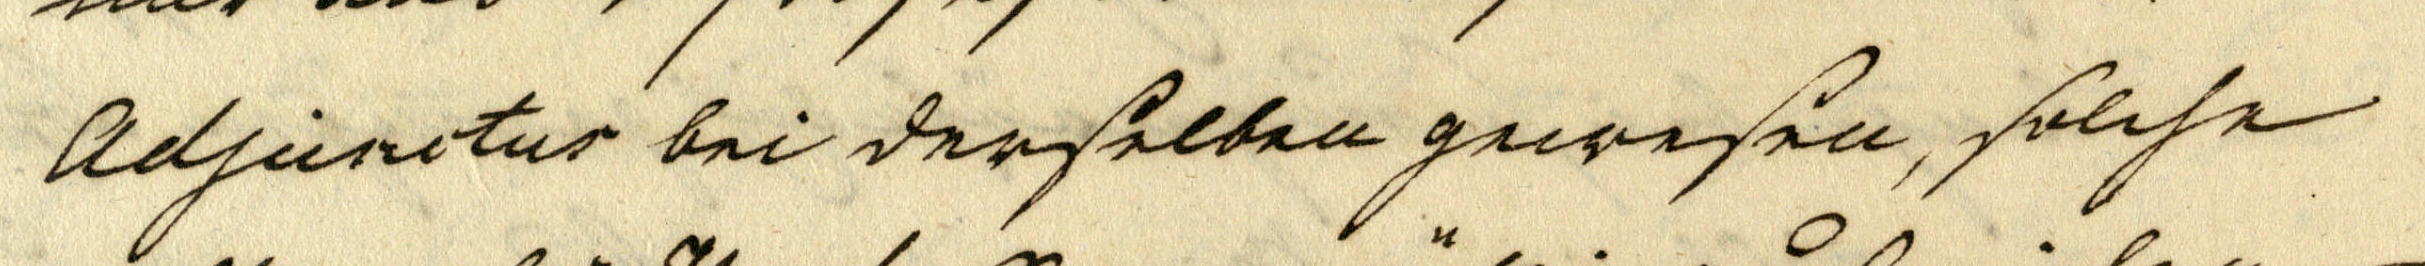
Adjunctus bei derselben gewesen, solche
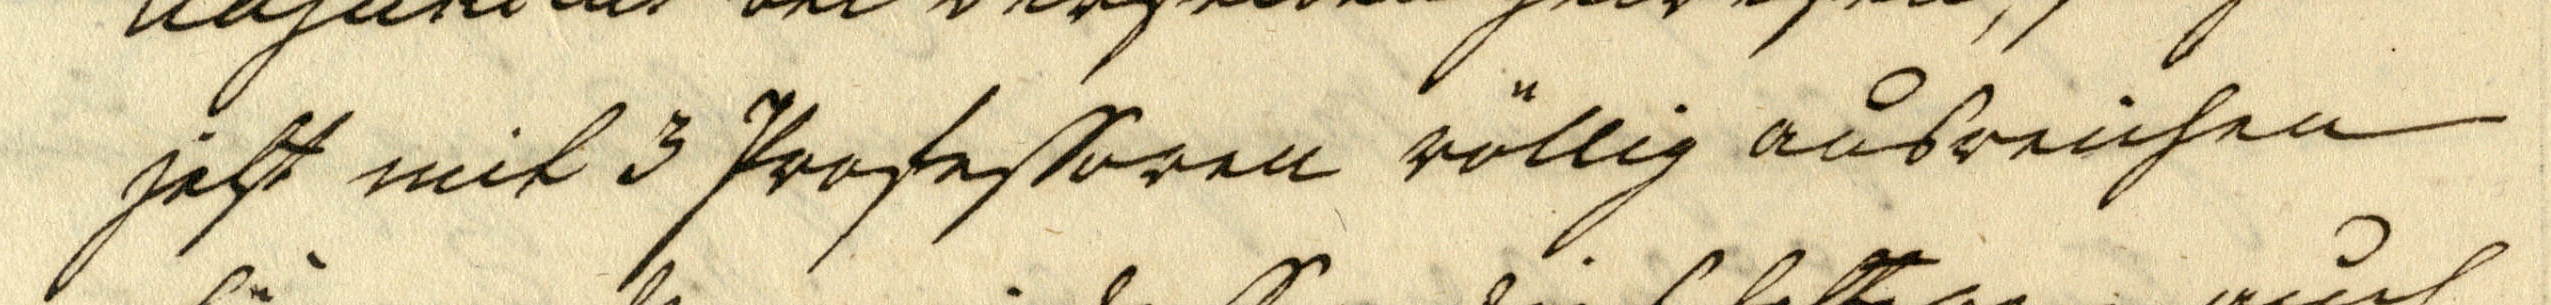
jetzt mit 3 Professoren völlig ausreichen
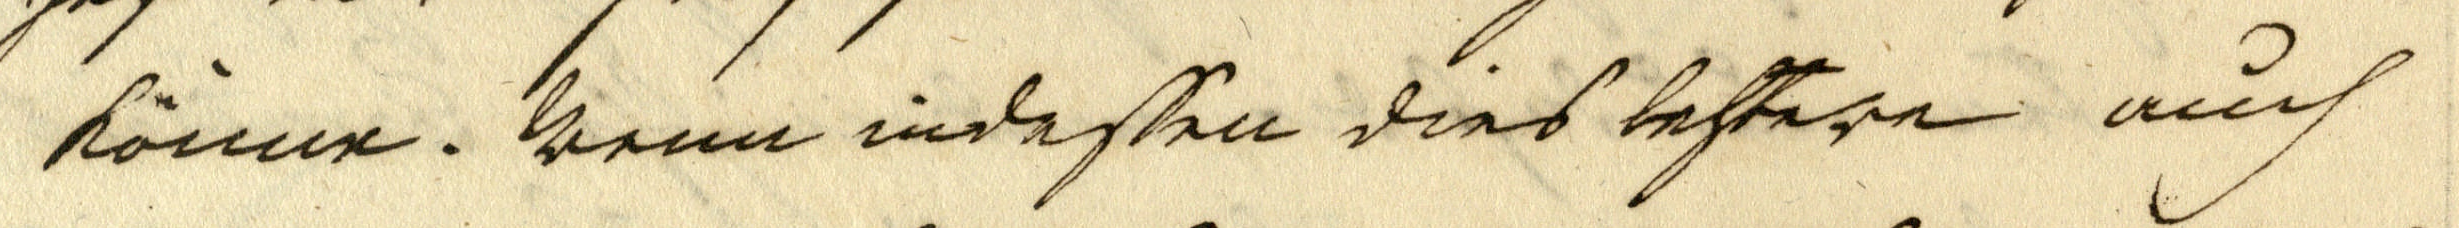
könne. Wenn indessen dies letztere auch
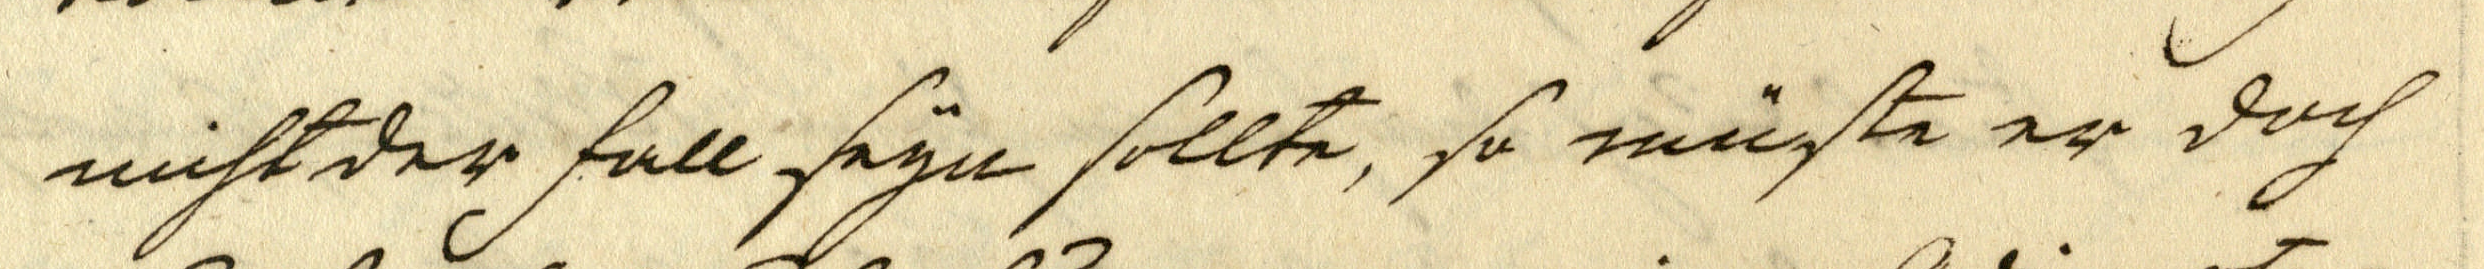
nicht der Fall seyn sollte, so müßte er doch
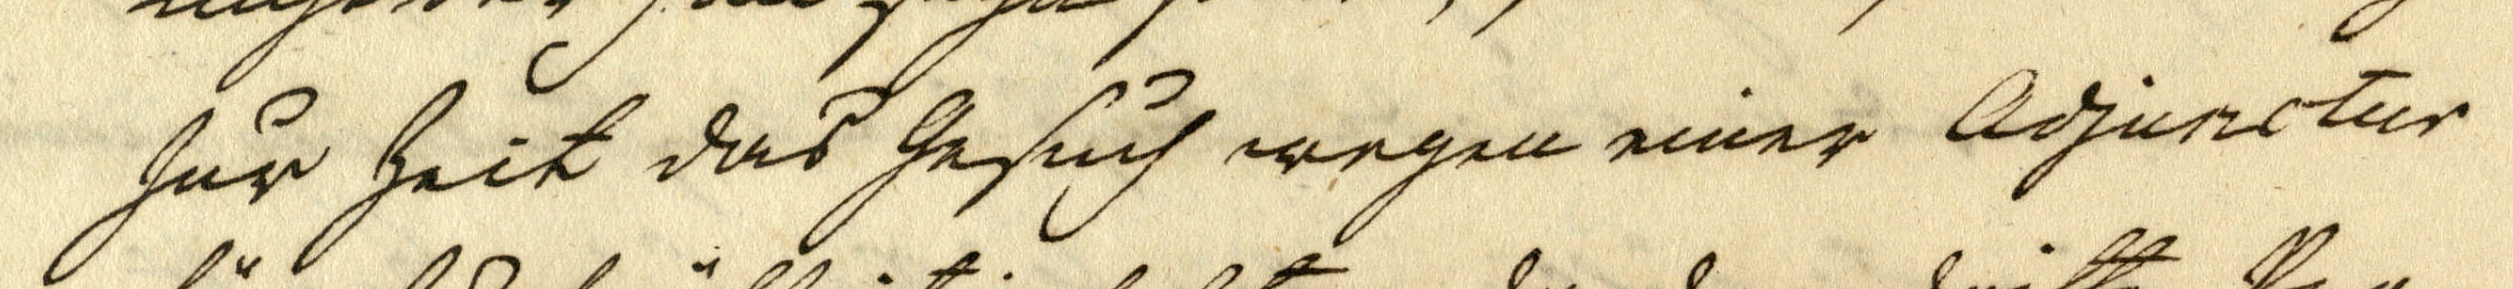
zur Zeit das Gesuch wegen einer Adjunctur
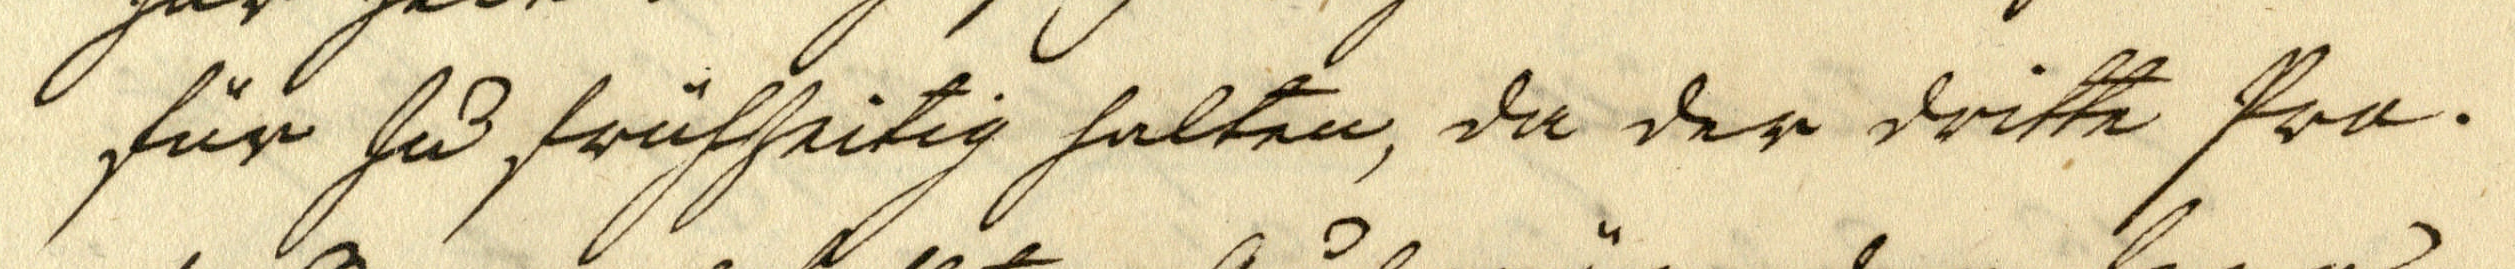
für zu frühzeitig halten, da der dritte Pro-
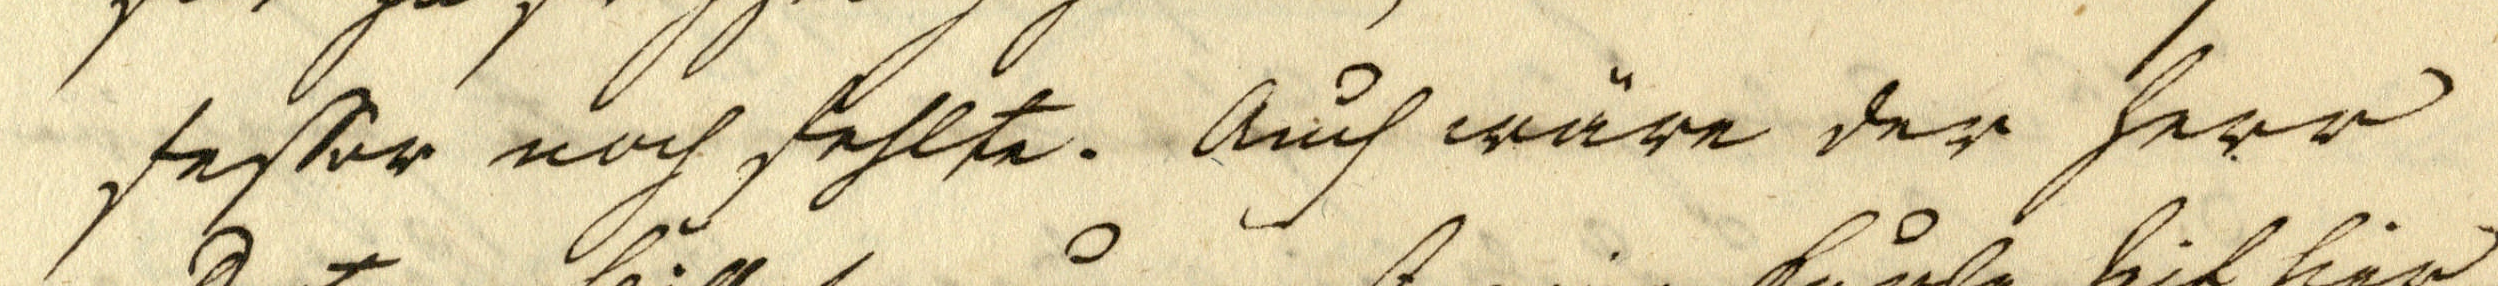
fessor noch fehlte. Auch wäre der herr
